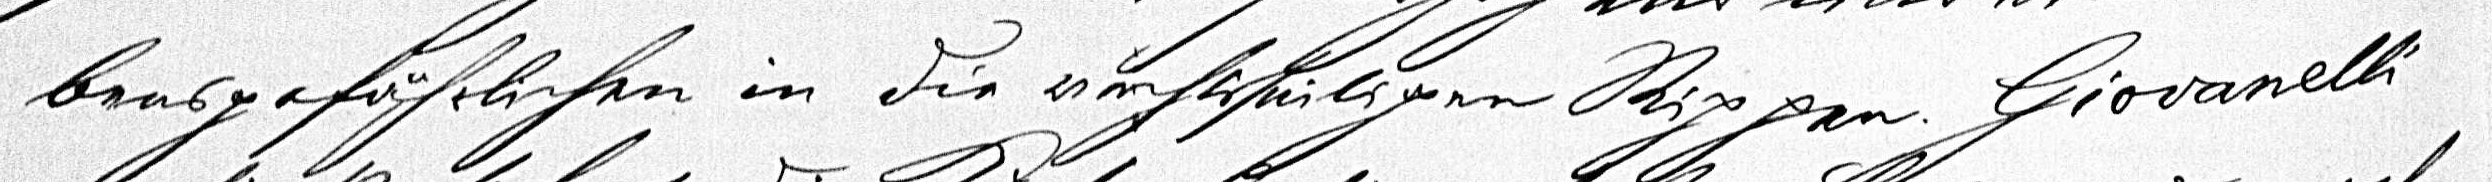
bensgefährlichen in die rechtsseitigen Rippen. Giovanelli
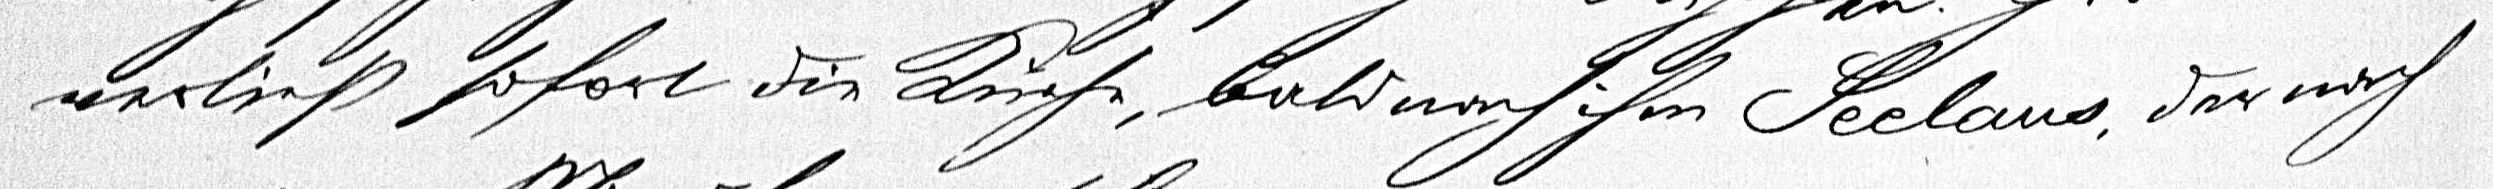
verließ sofort die Küche, bald nach ihm Seelaus, der nach
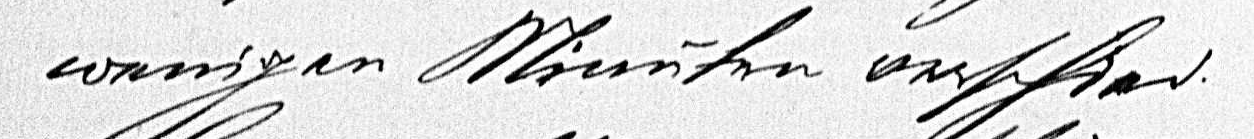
wenigen Minuten verschied.
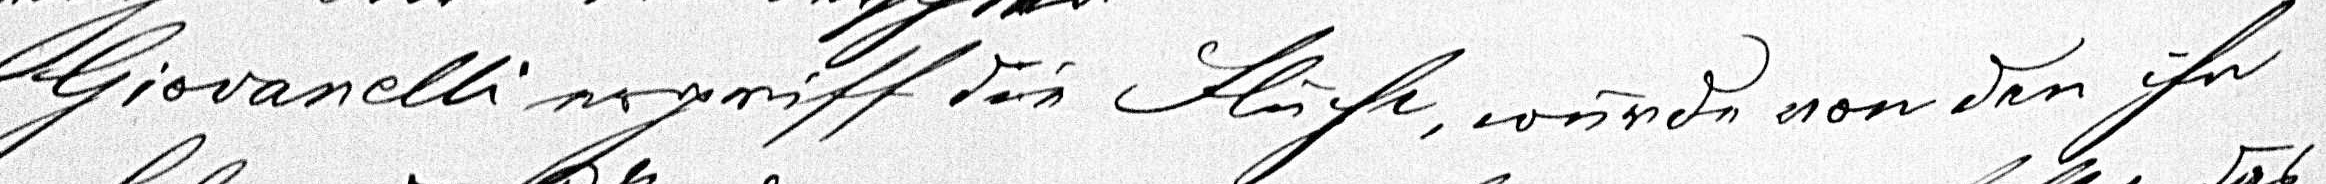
Giovanelli ergriff die Flucht, wurde von den ich
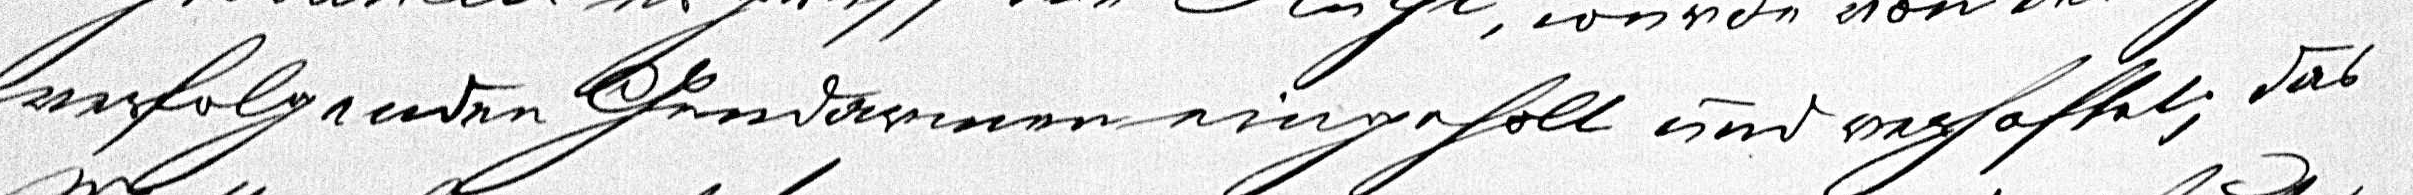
verfolgenden Gendarmen eingeholt und verhaftet, das
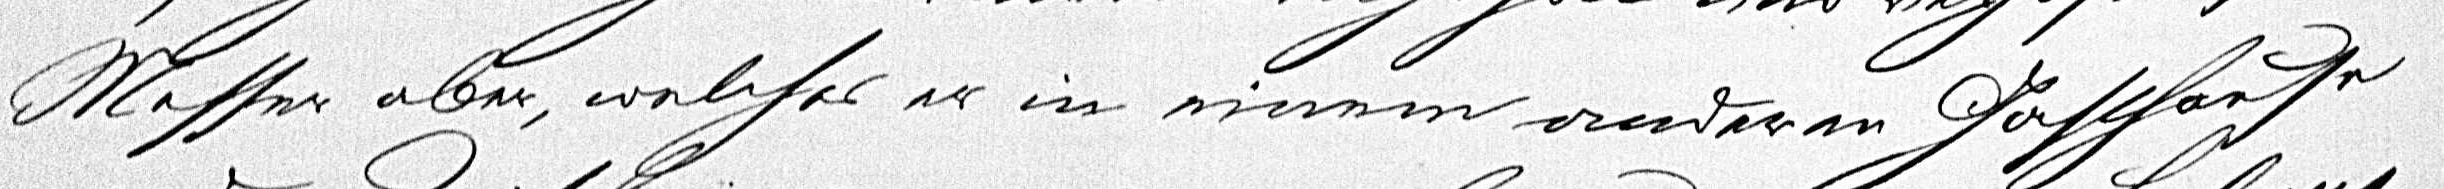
Messer aber, welches er in einen anderen Gasthause
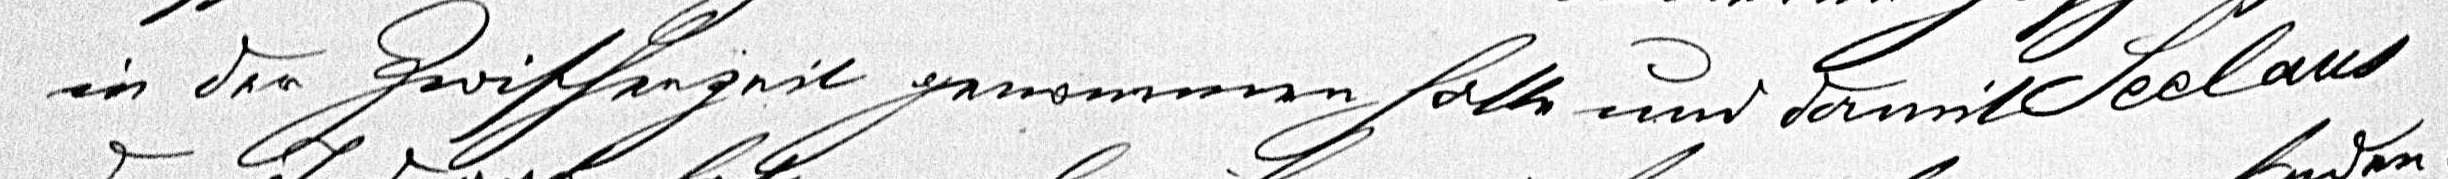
in der Zwischenzeit genommen hatte und damit Seelaus
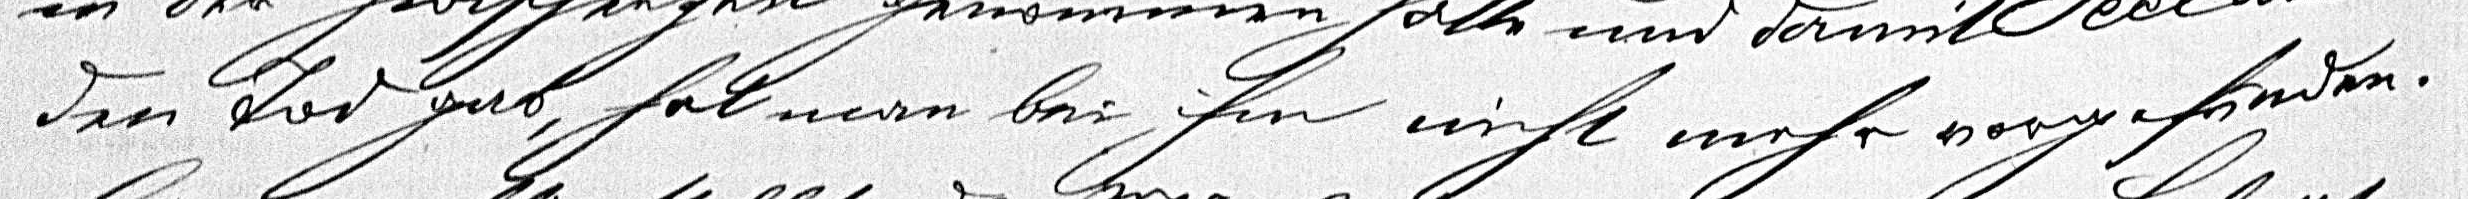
den Tod gab, hat man bei ihm nicht mehr vorgefunden.
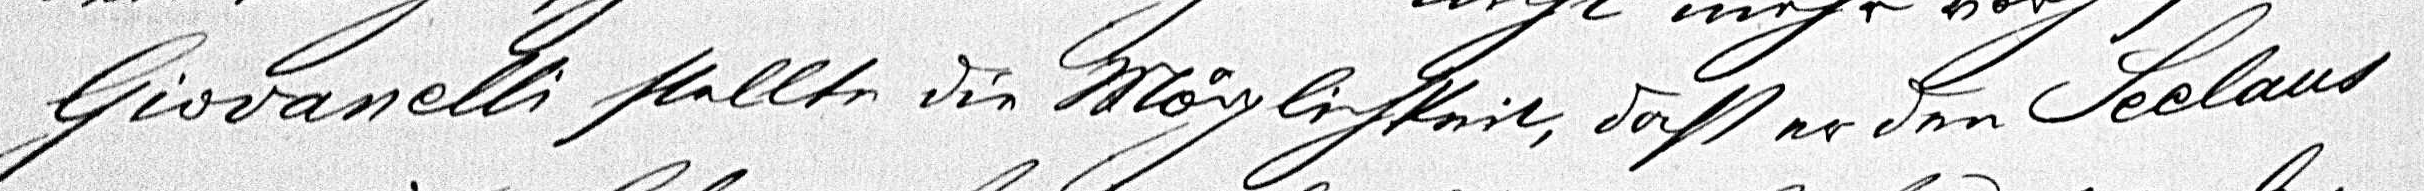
Giovanelli stellte die Möglichekeit, daß er den Seelaus
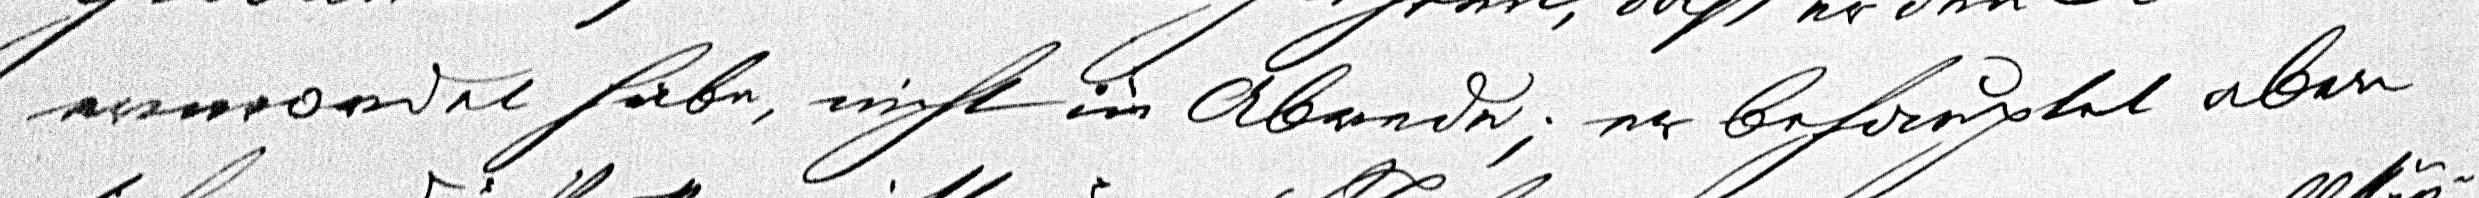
ermordet habe, nicht in Abrede, er behauptet aber
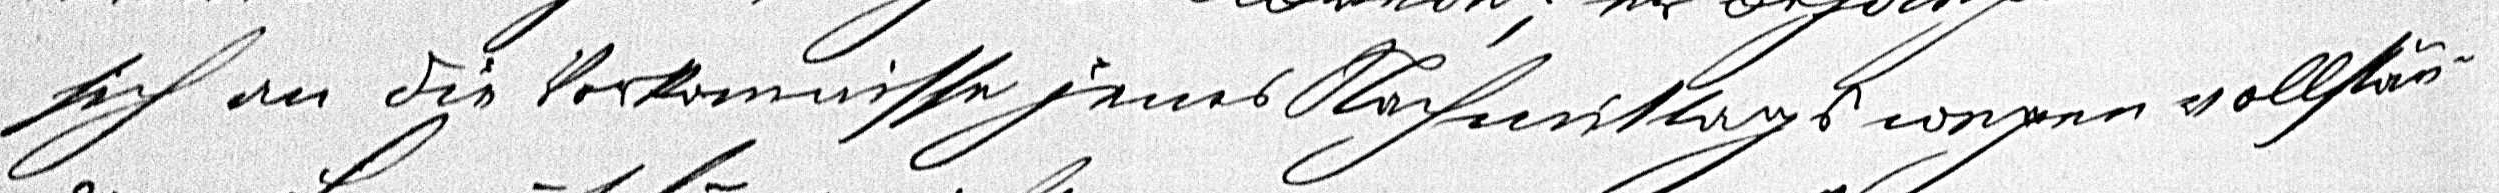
sich an die Vorkomnisse jenes Nachmittags wegen vollstän¬
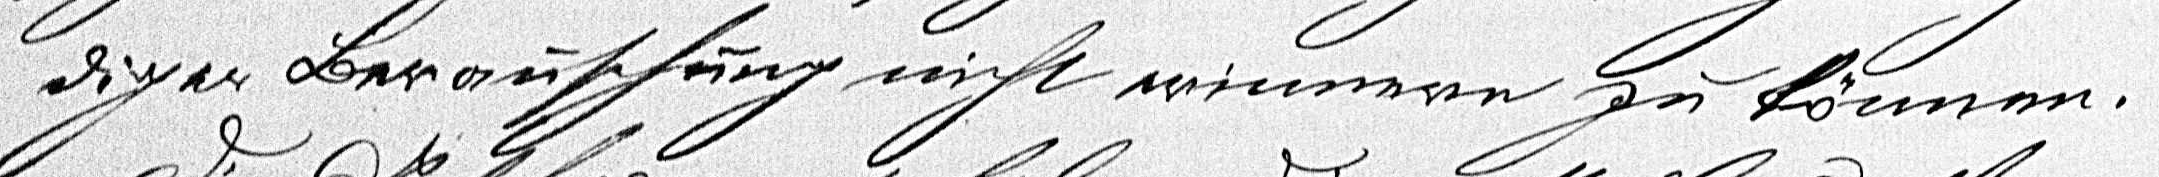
diger Berauschug nicht erinnern zu können.
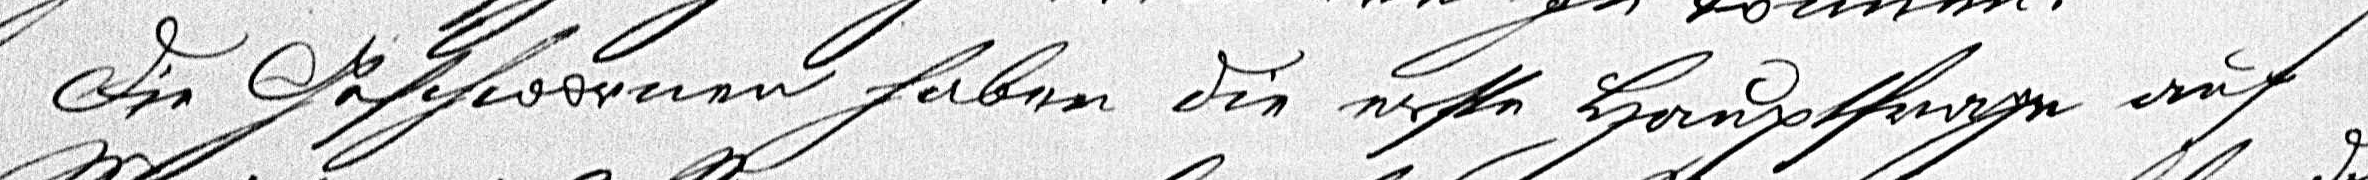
Die Geschworenen haben die erste Hauptfrage auf
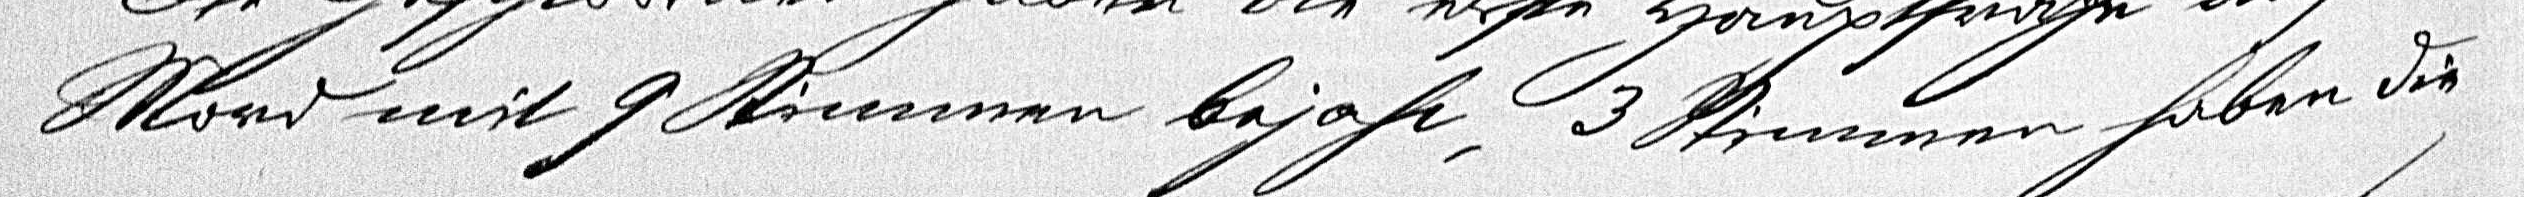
Mord mit 9 Stimmen bejaht, 3 Stimmen haben die
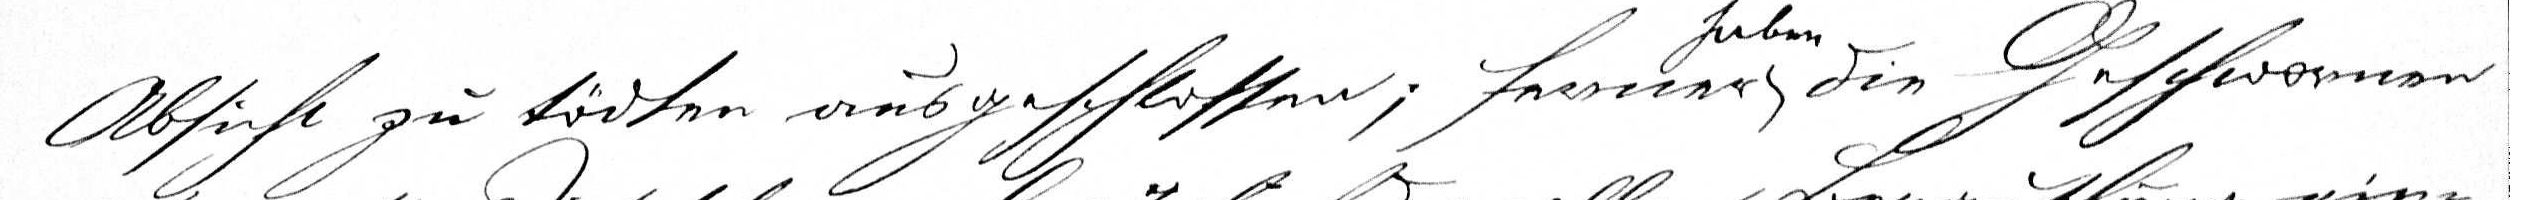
Absicht zu tödten ausgeschlossen; ferner die Geschwornen
